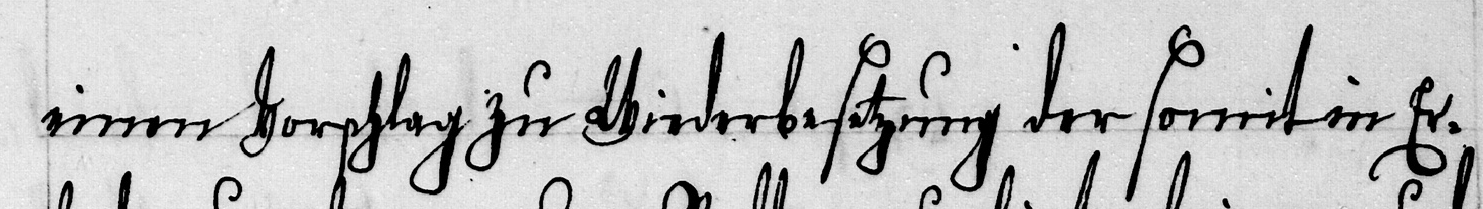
einen Vorschlag zu Wiederbesetzung der somit in Er¬
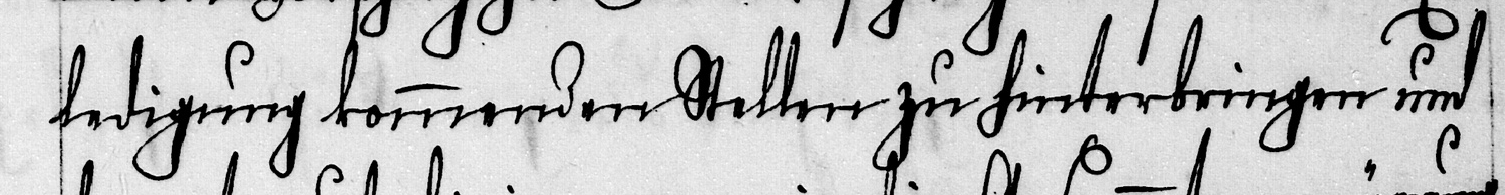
ledigung kommenden Stellen zu hinterbringen und
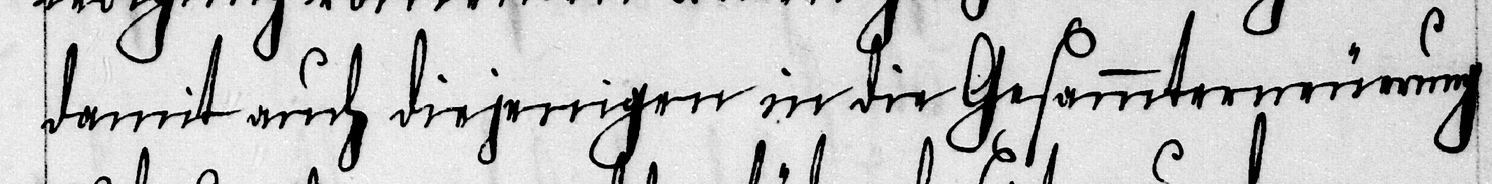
damit auch diejenigen in die Gesammterneuerung
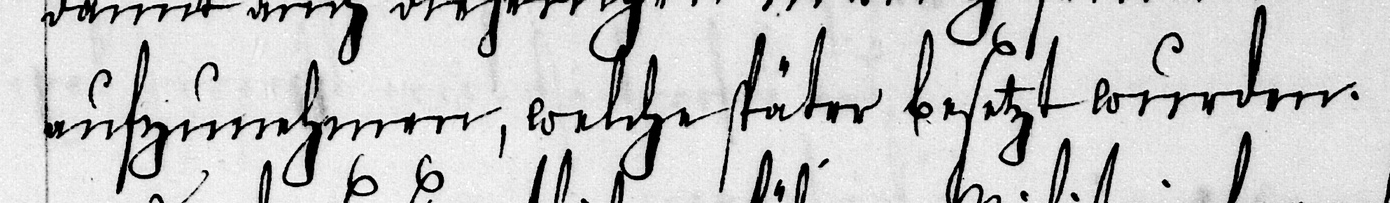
aufzunehmen, welche später besetzt wurden.
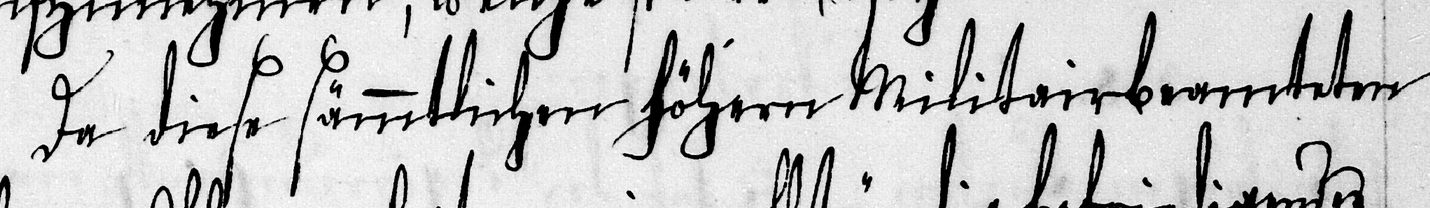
Da diese sämmtlichen höhern Militairbeamteten
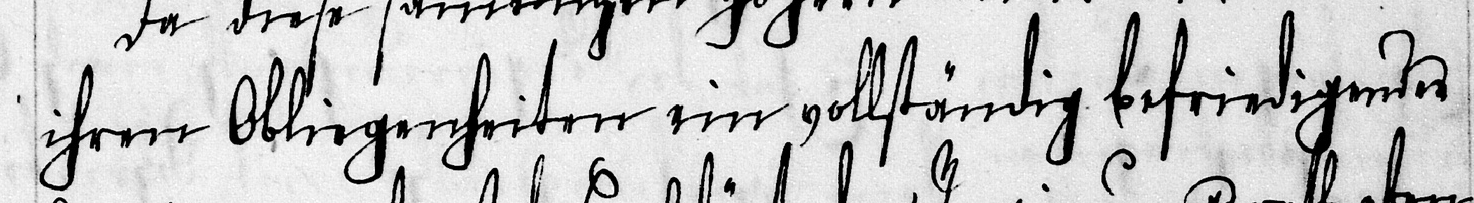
ihren Obliegenheiten ein vollständig befriedigendes
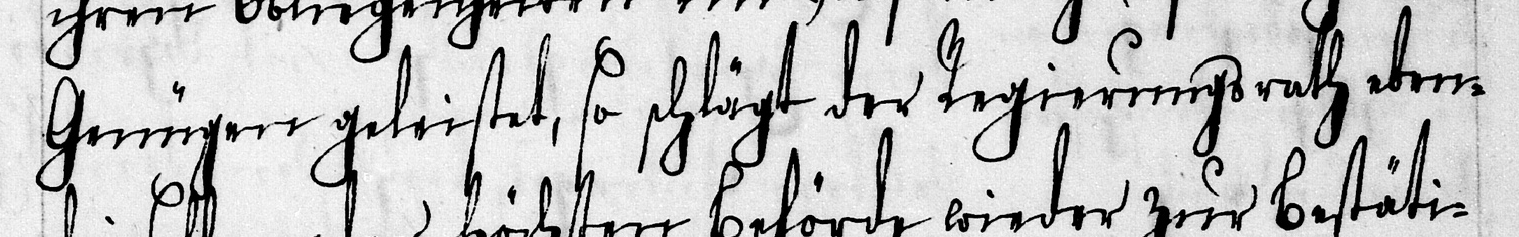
Genügen geleistet, so schlägt der Regierungsrath eben¬
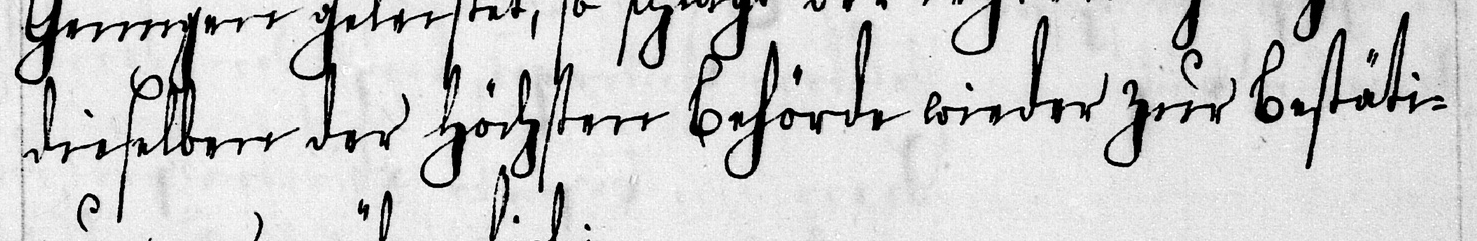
dieselben der Höchsten Behörde wieder zur Bestäti¬
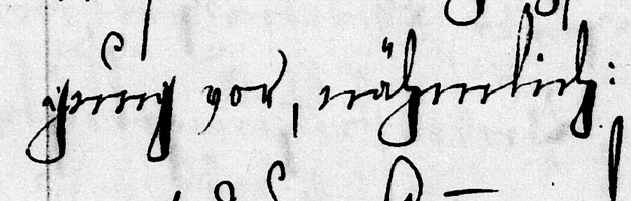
gung vor, nähmlich:
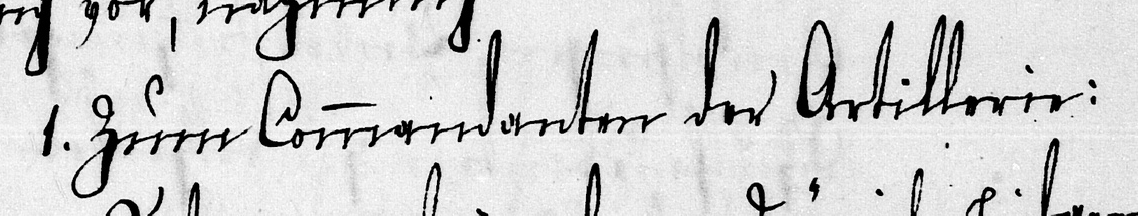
1.) Zum Commandanten der Artillerie:
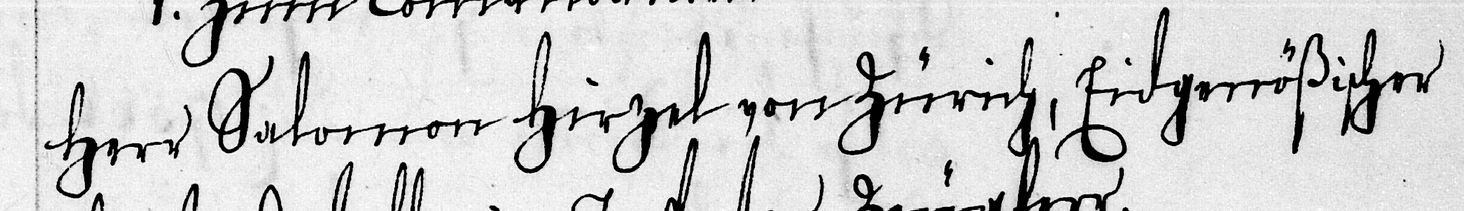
Herr Salomon Hirzel von Zürich, Eidgenößischer
